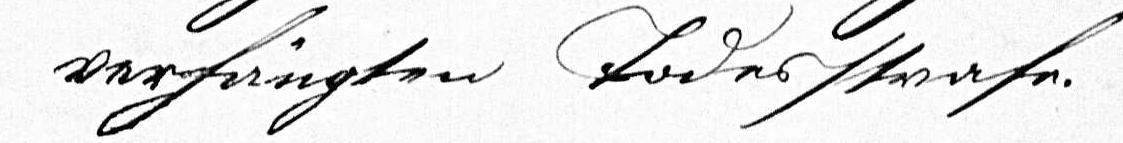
verhängten Todesstrafe.
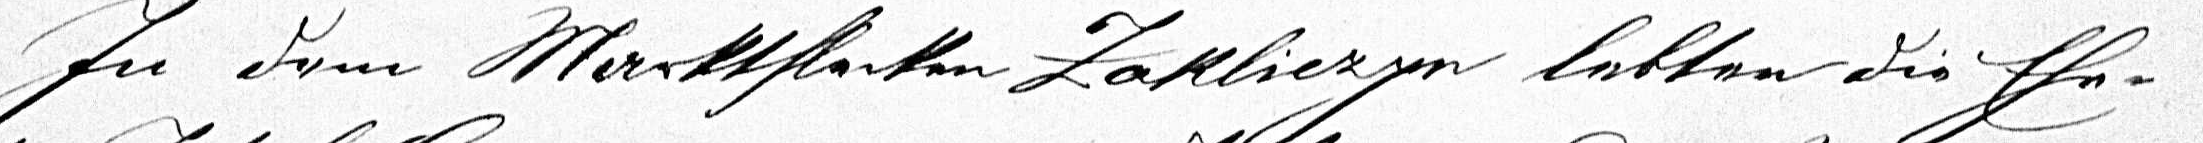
In dem Marktflecken Zakliczyn ebten die Ehe¬
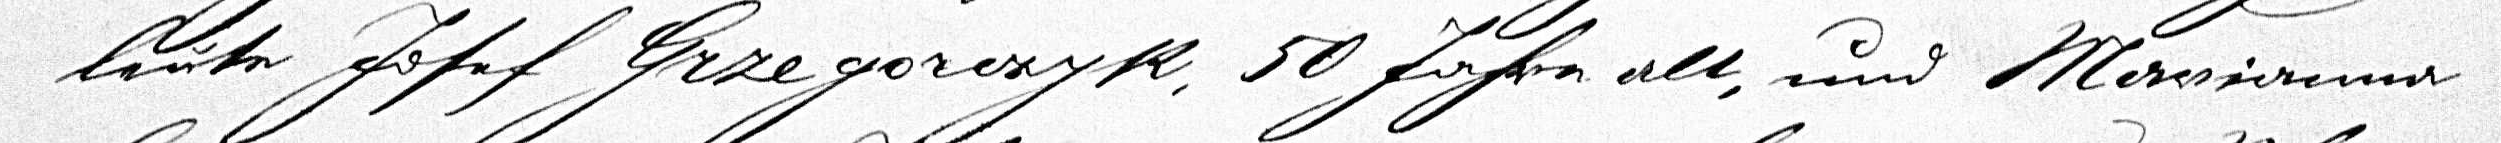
leute Josef Grzegorczyk, 50 Jahre alt, und Marianna
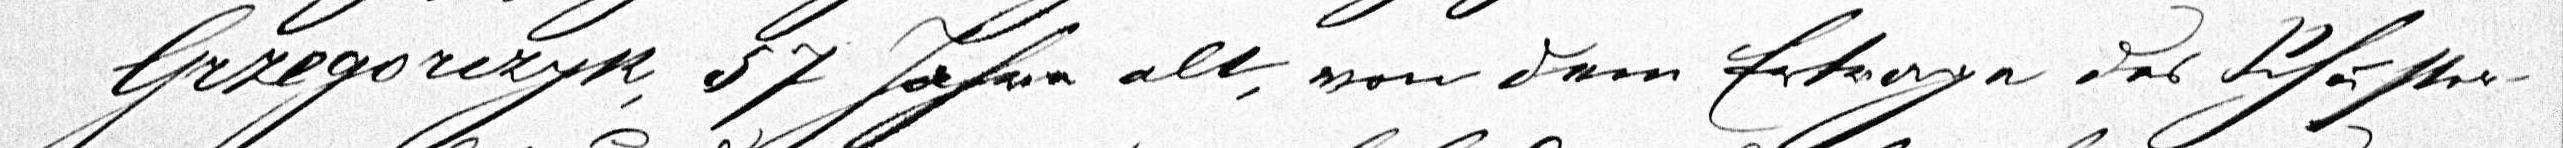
Grzegorczyk, 57 Jahre alt, von dem Ertrage des Schuster¬
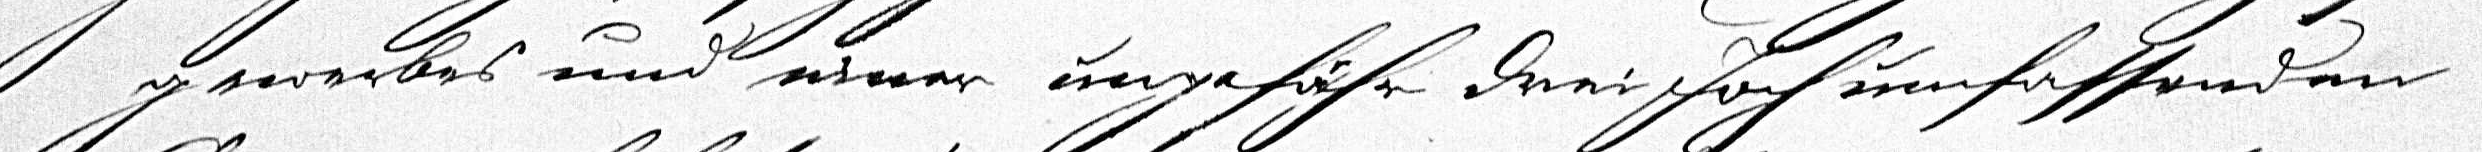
gewerbes und einer ungefähr drei Joch umfassenden
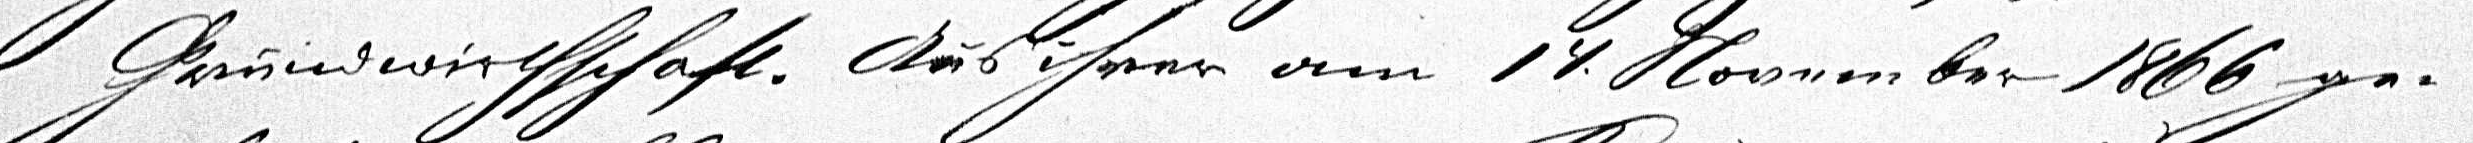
Grundwirtschaft. Aus ihrer am 14. November 1866 ge¬
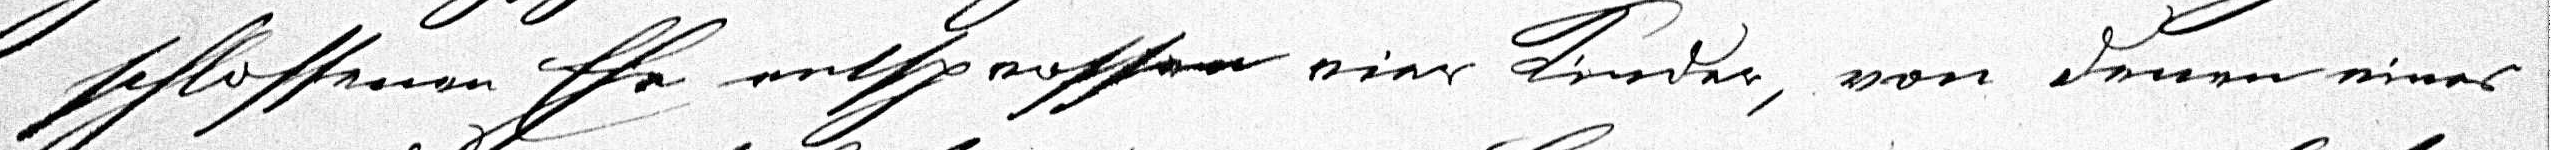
schlossenen Ehe entsprossen vier Kinder, von denen eines
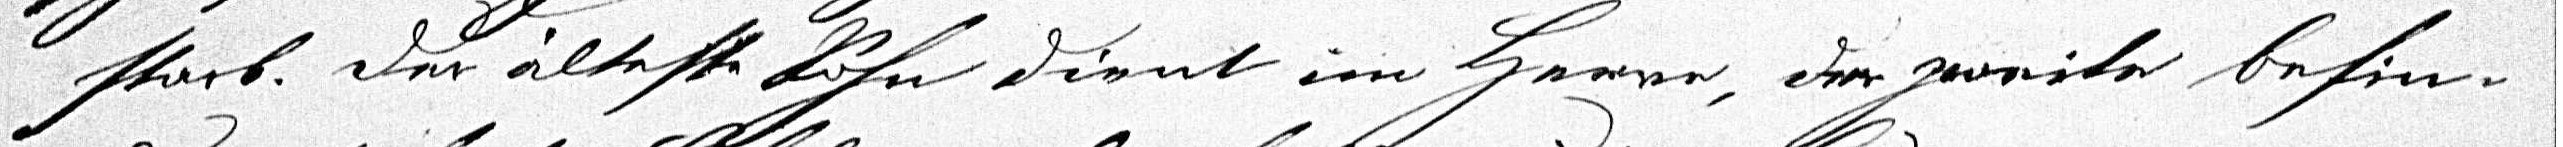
starb. Der älteste Sohn dient im Heere, der zweite befin¬
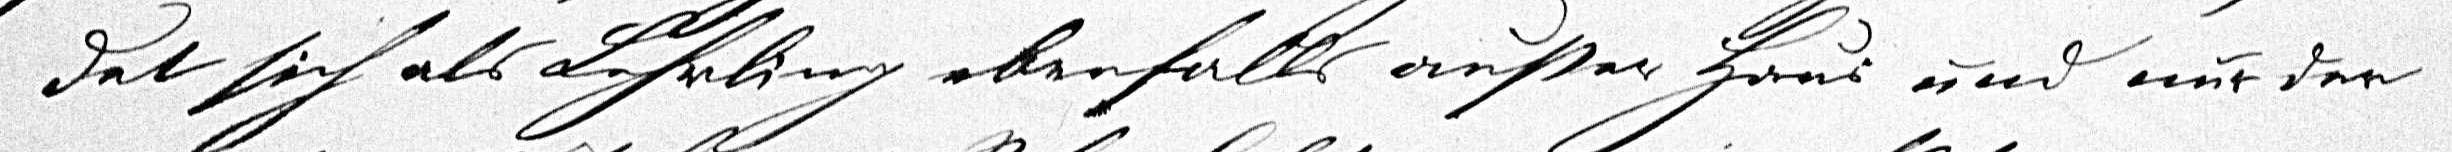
det sich als Lehrling ebenfalls außer Haus und nur der
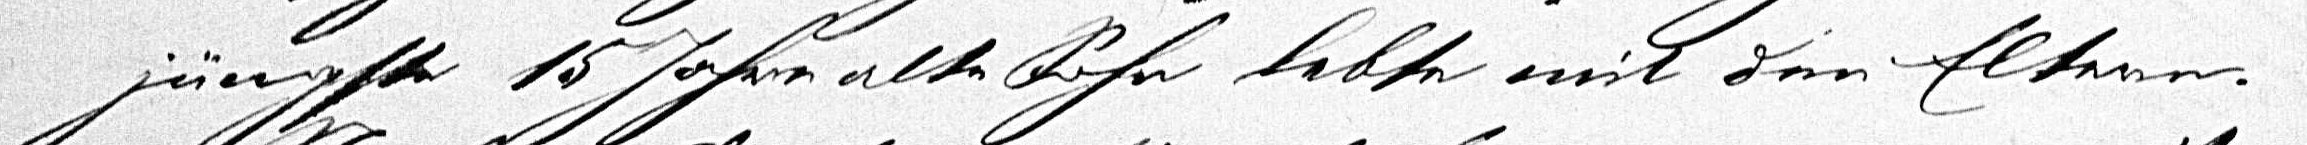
jüngste 15 Jahre alte Sohn lebte mit den Eltern.
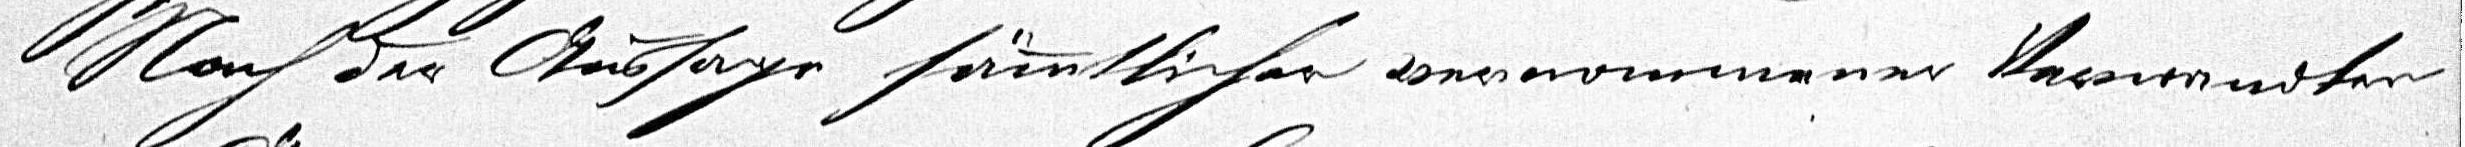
Nach der Aussage sämmtlicher vernommener Verwandter
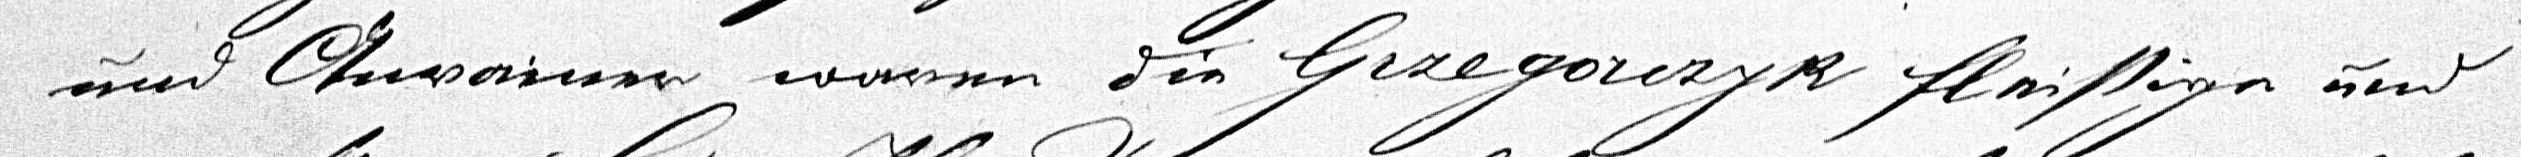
und Anrainer waren die Grzegorczyk fleißige und
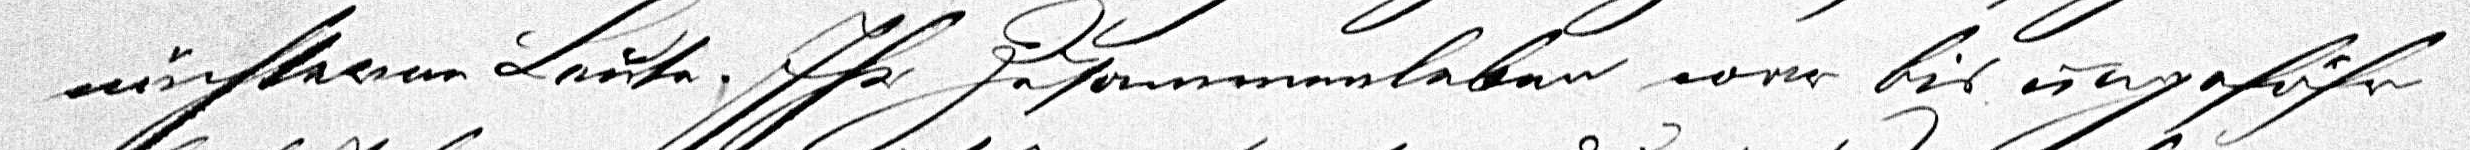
nüchterne Leute, Ihr Zusammenleben war bis ungefähr
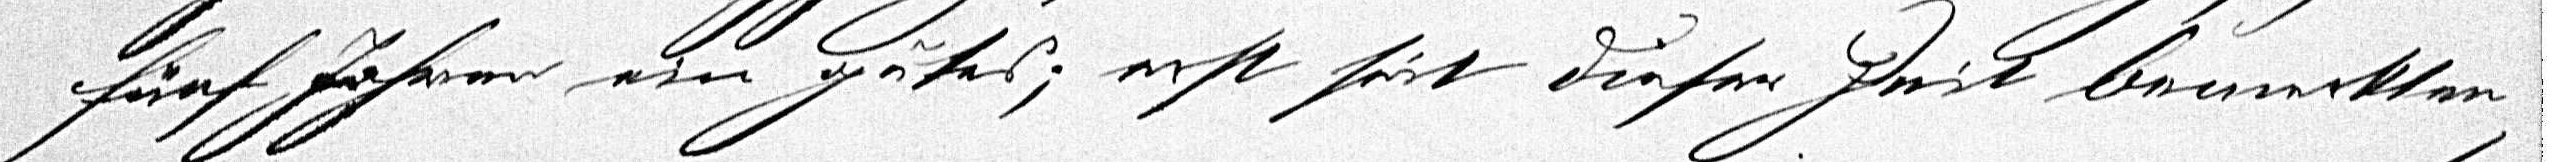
fünf Jahren ein gutes; erst seit dieser Zeit bemerkten
